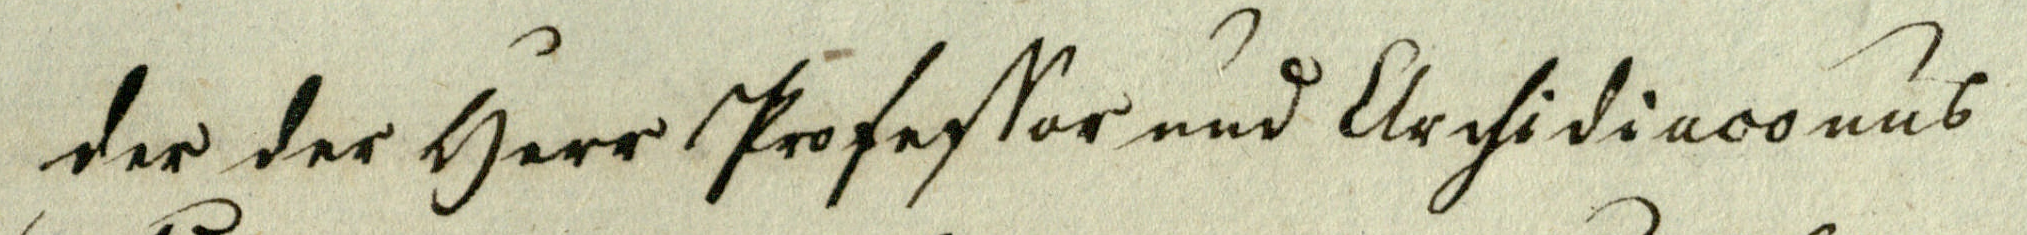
der der Herr Professor und Archidiaconus
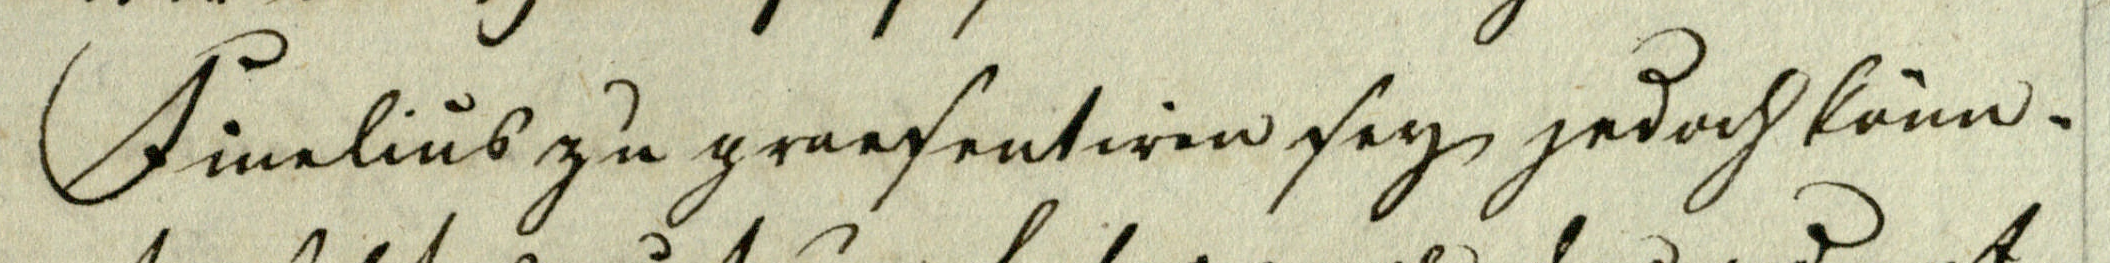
Finelius zu praesentiren sey jedoch könn¬
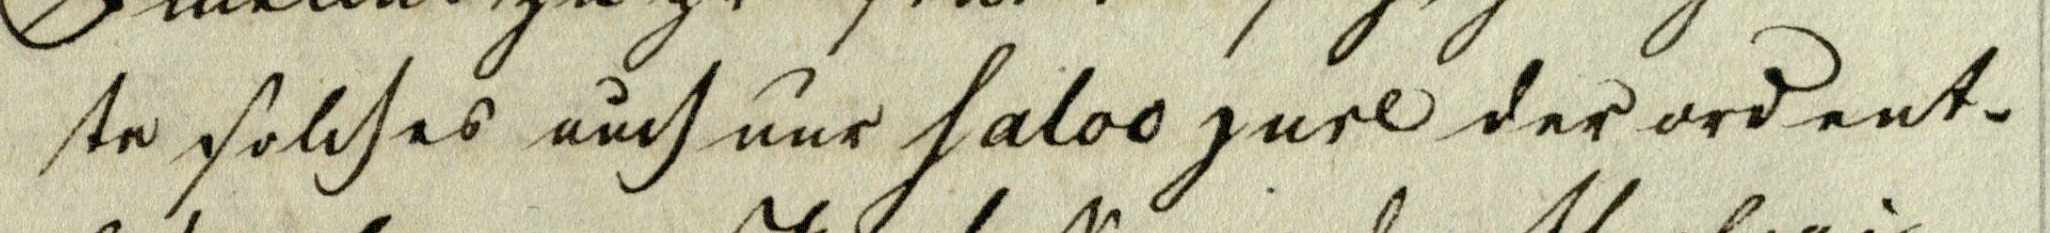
te solches auch und hato jure der ordent¬
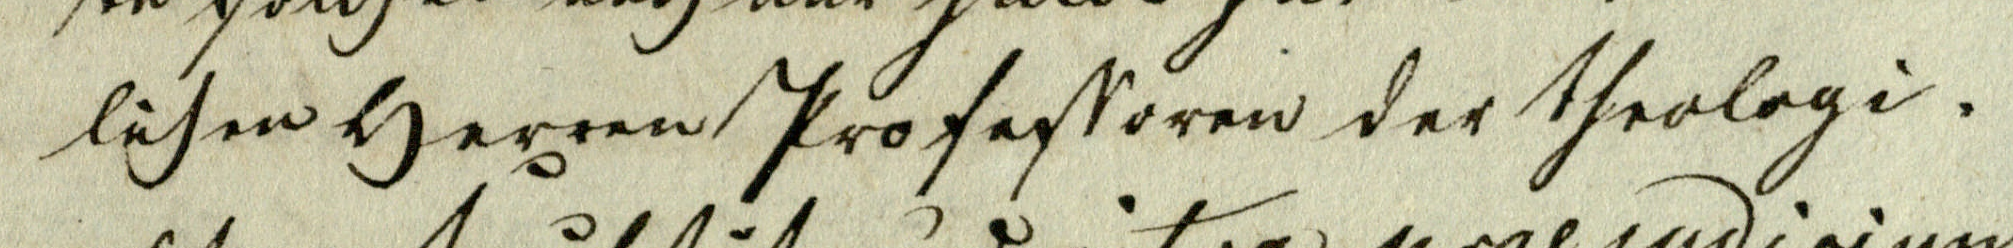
lichen Herren Professoren der theologi¬
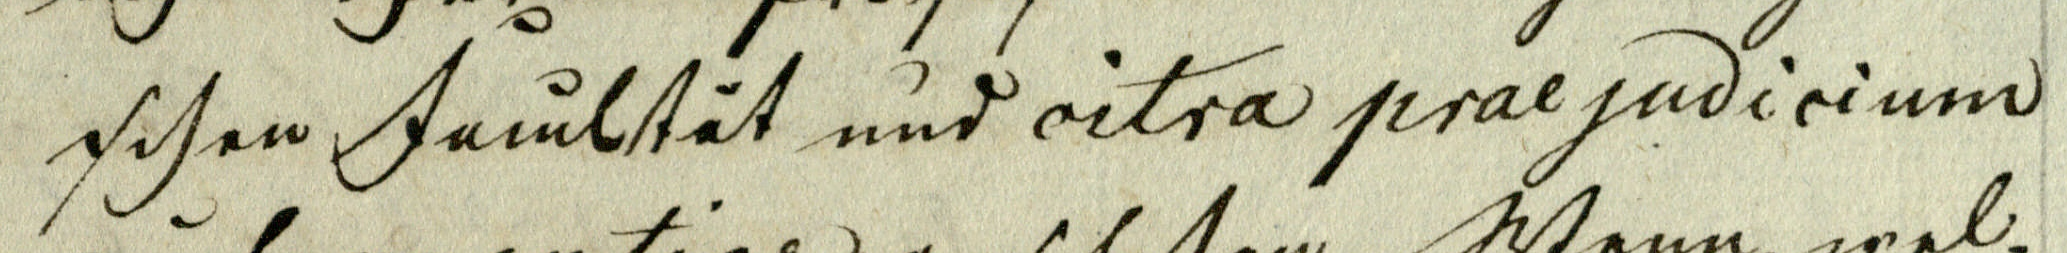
schen Facultät und citra prae judicium
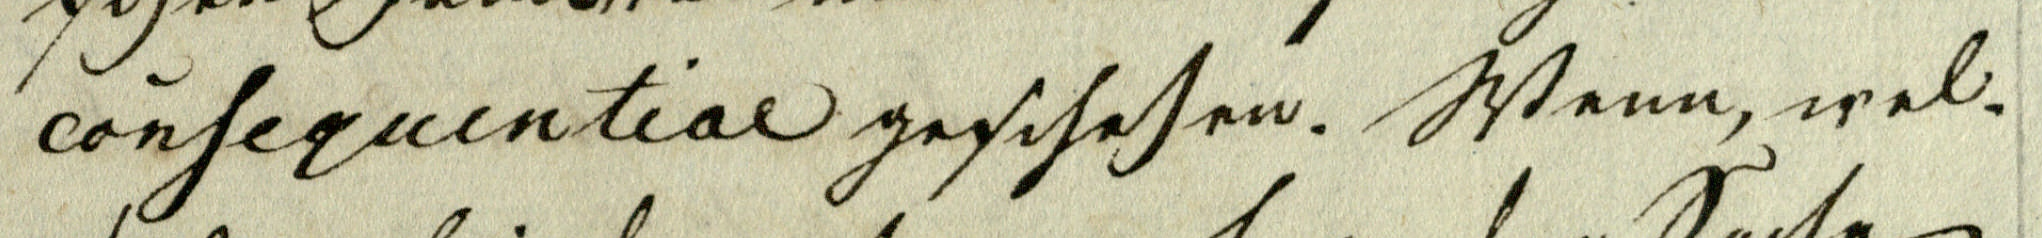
consequentiae geschehen. Wann, wel¬
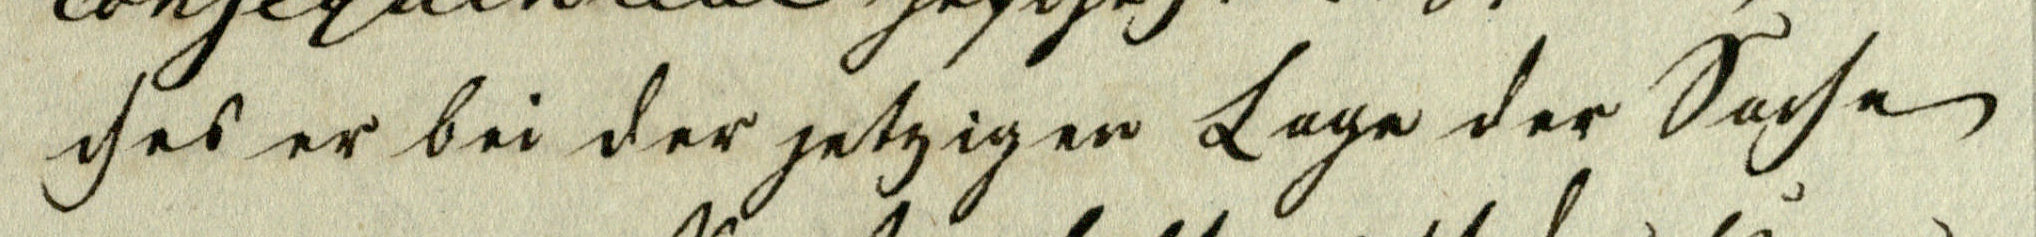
ches er bei der jetzigen Lage der Sache
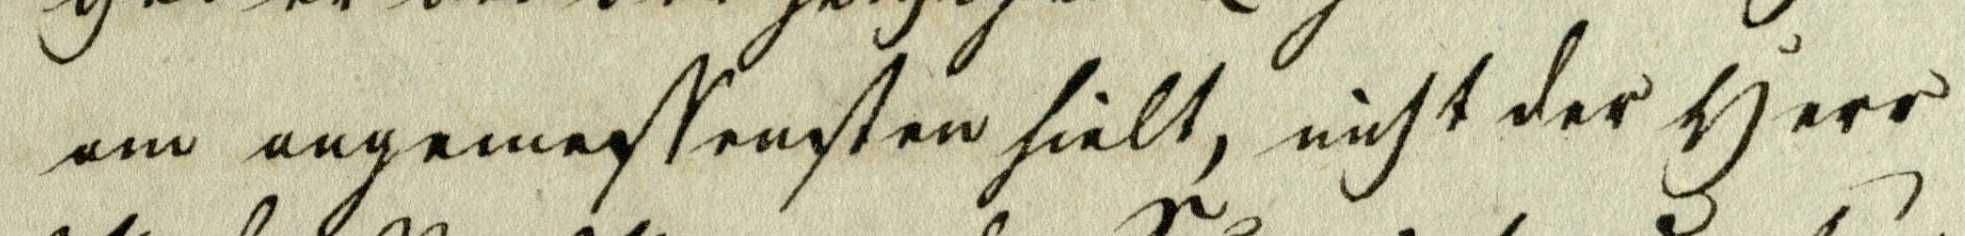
am angemessensten hielt, nicht der Herr
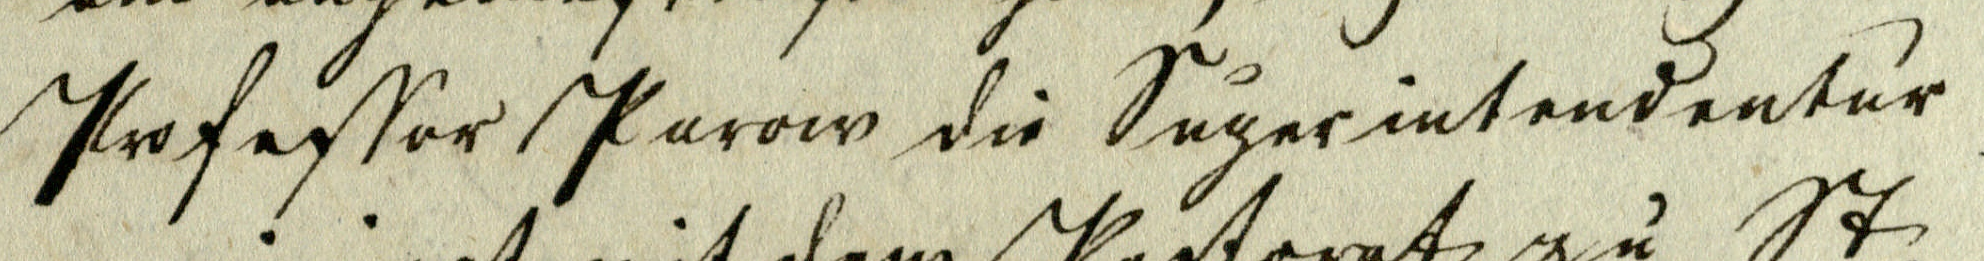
Professor Parow die Superintendentur
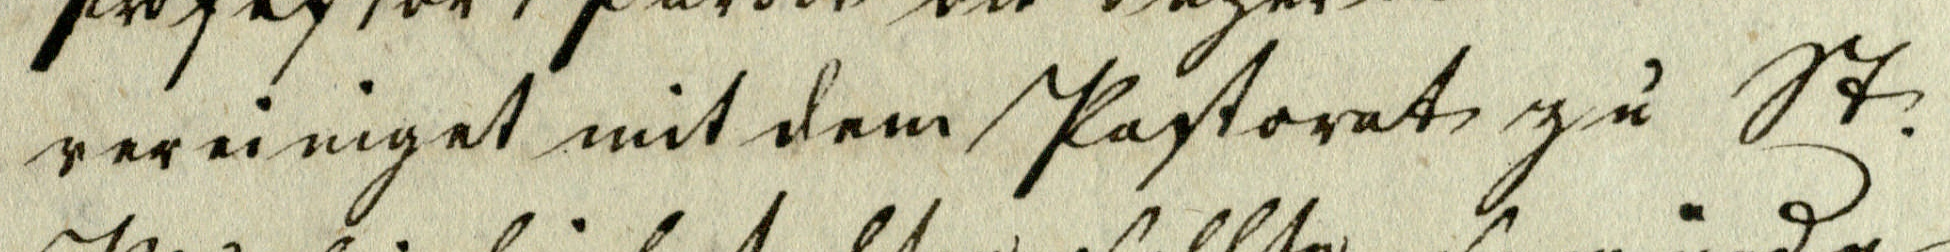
vereiniget mit dem Pastorat zu St.
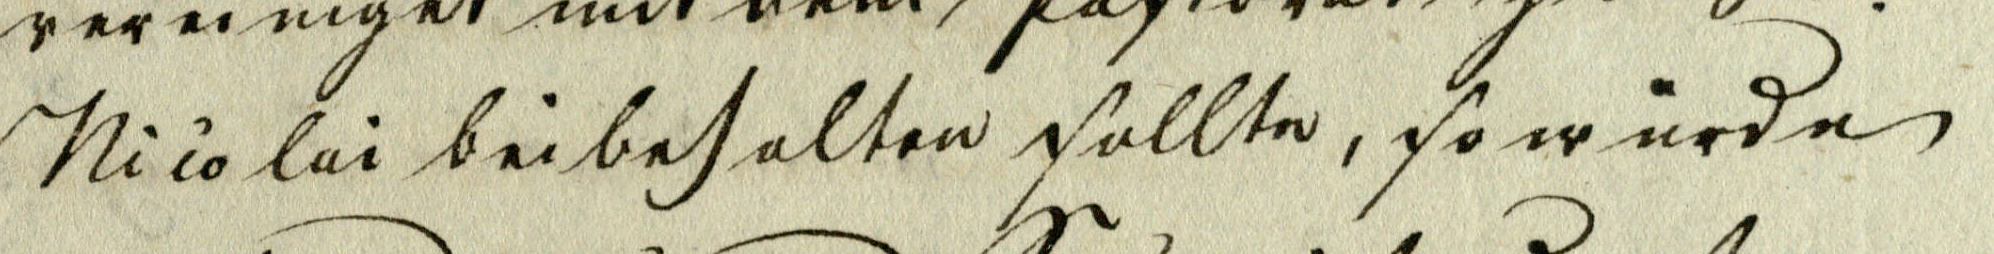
Nicolai beibehalten sollte, so würde
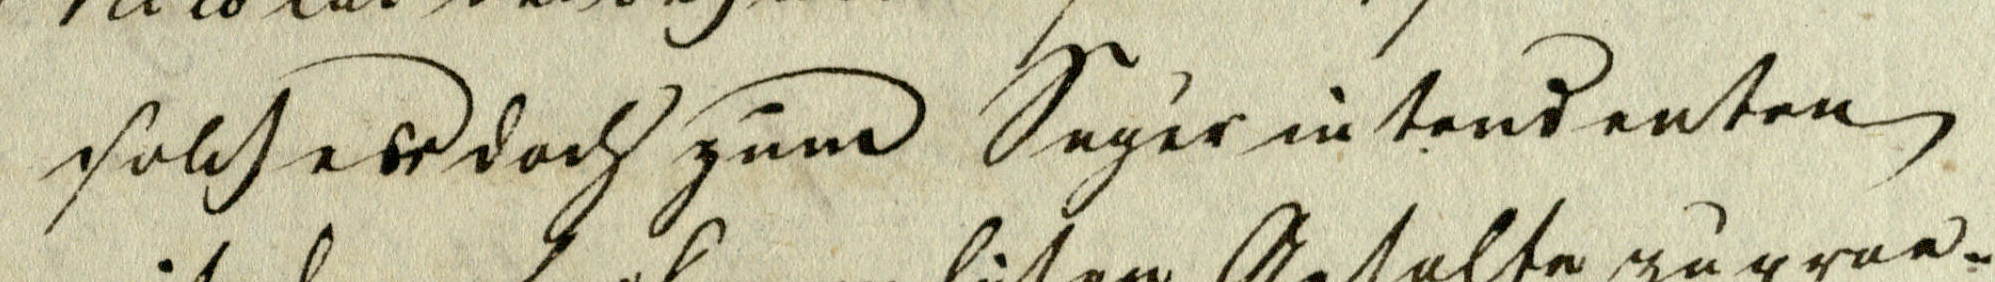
solcher doch zum Superintendenten
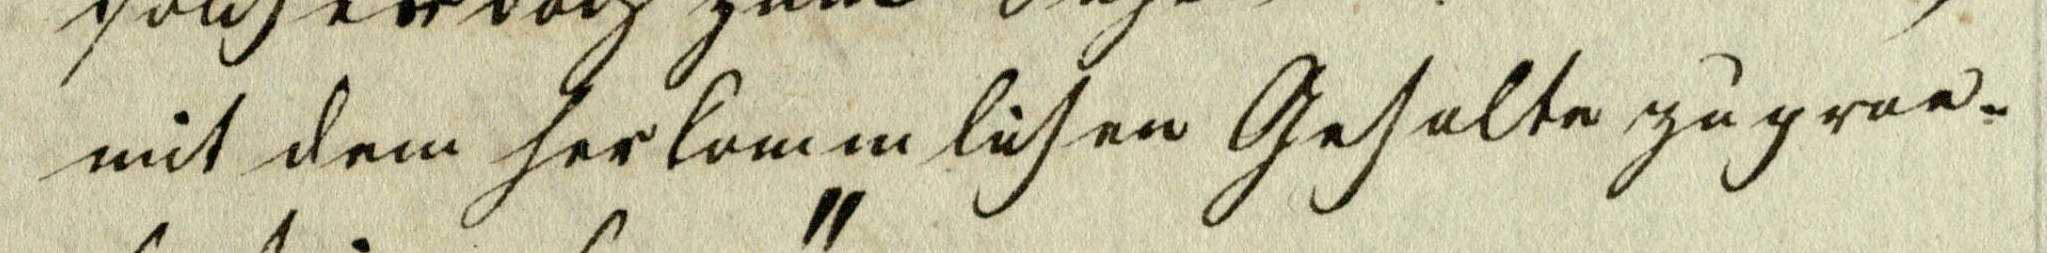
mit dem herkommlichen Gehalte zu prae¬
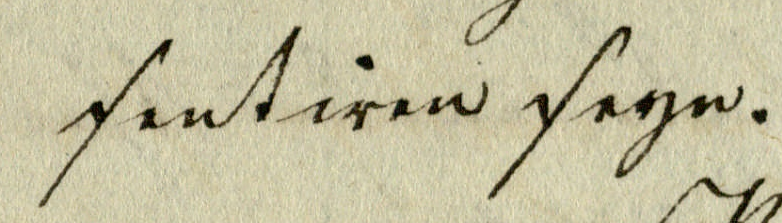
sentiren seyn."
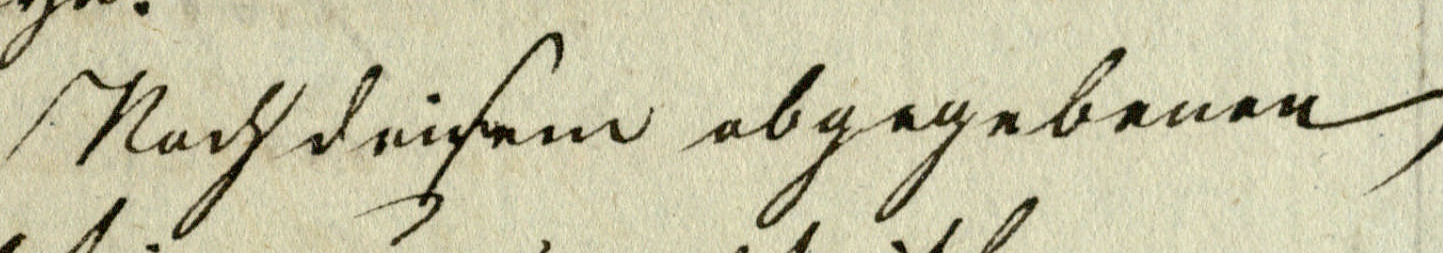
Nach diesem abgegebenen
